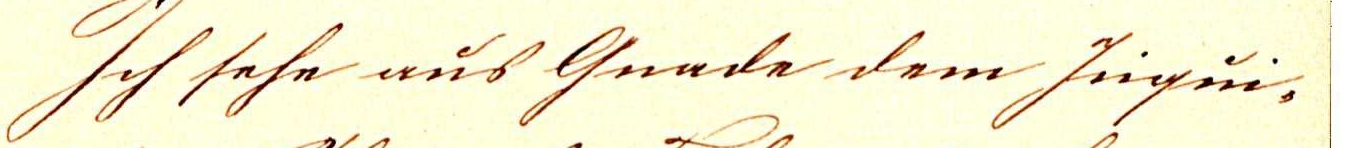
Ich sehe aus Gnade dem Jnqui¬
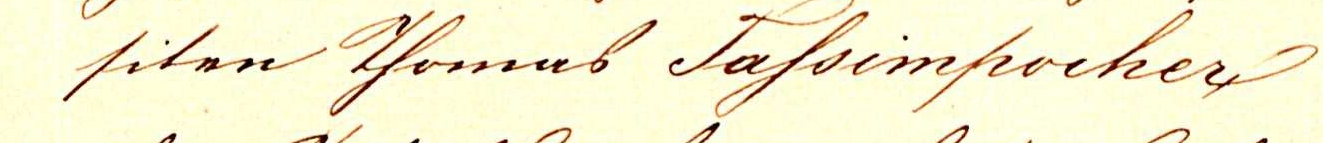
siten Thomas Tassimpocher
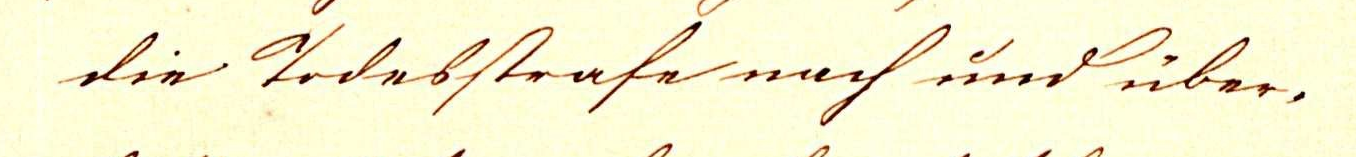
die Todesstrafe nach und über¬
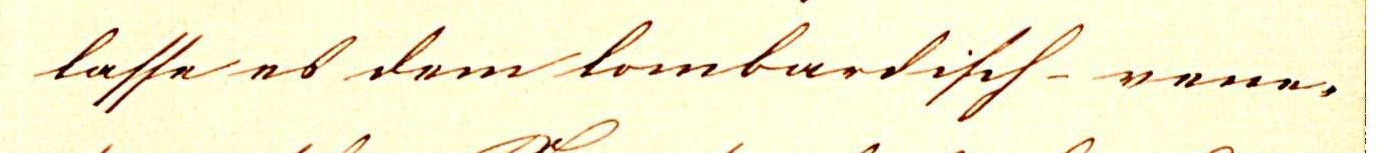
lasse es dem lombardisch - vene¬
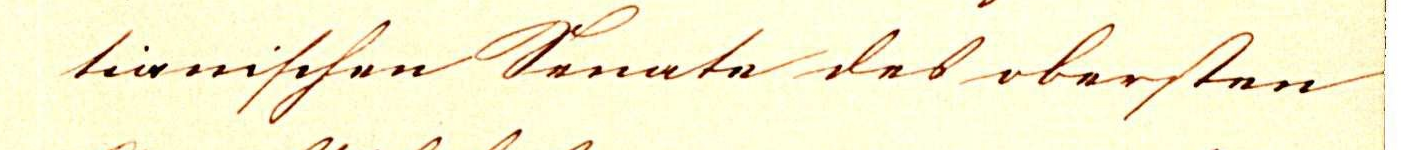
tianischen Senate des obersten
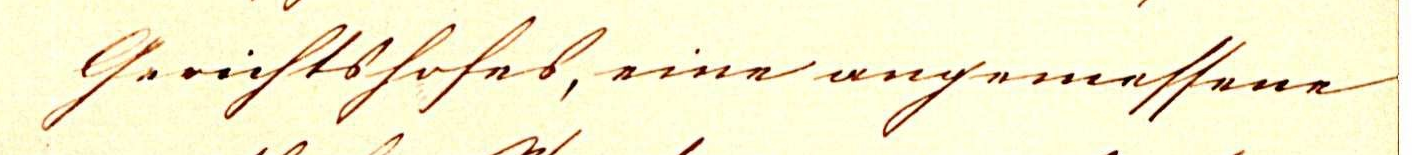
Gerichtshofes, eine angemessene
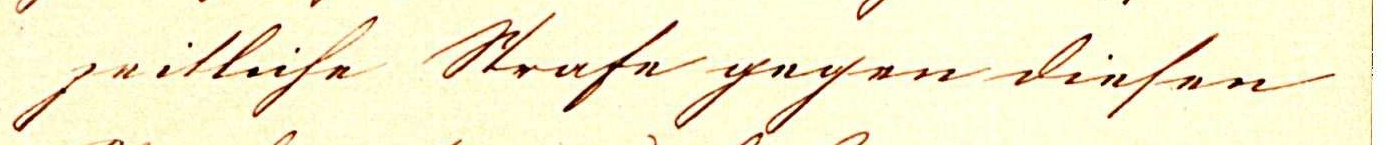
zeitliche Strafe gegen diesen
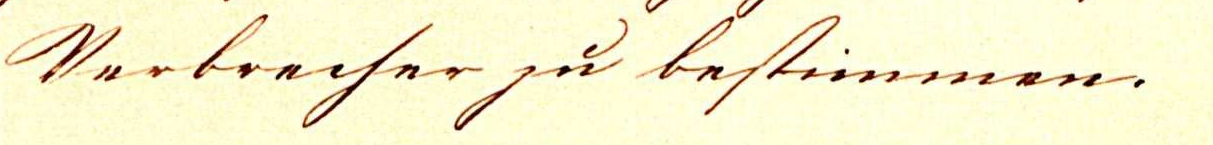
Verbrecher zu bestimmen.
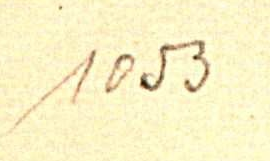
1053
